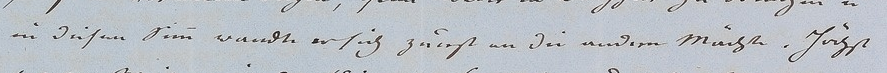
in diesem Sinne wandte er sich zuerst an die andern Mächte. Höchst
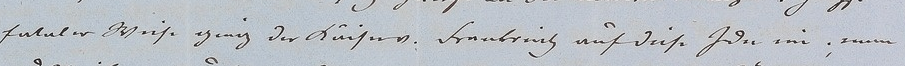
fataler Weise ging der Kaiser v. Frankreich auf diese Idee ein; man
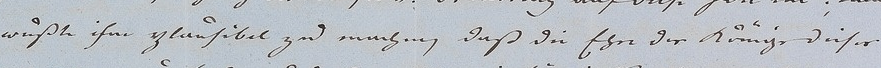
wußte ihm plausibel zu machen, daß die Ehre des Königs dieses
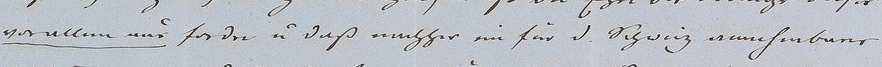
vor allem aus fordre und daß nachher ein für d. Schweiz annehmbares
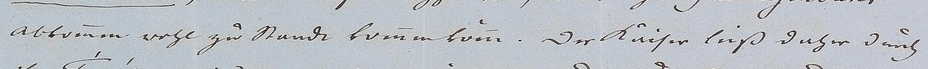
Abkommen wohl zu Stande kommen könne. Der Kaiser ließ daher durch
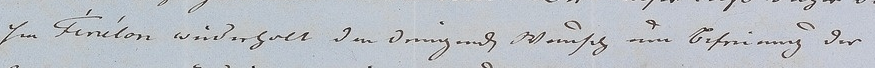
Hrn Fénélon wiederholt den dringenden Wunsch um Befreiung der
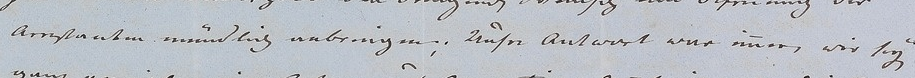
Arrestanten mündlich anbringen; Unsre Antwort war immer, wir seyen
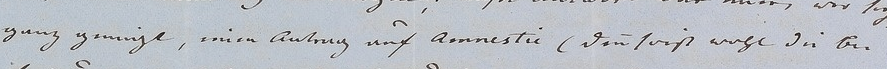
ganz geneigt, einen Antrag auf Amnestie (denn so ist wohl die Be-
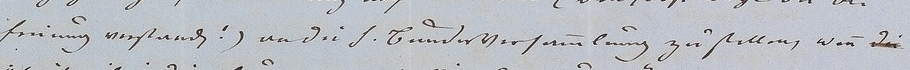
freiung verstanden!) an die h. Bundesversammlung zu stellen, wenn die
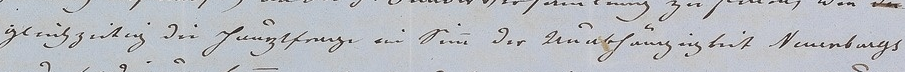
gleichzeitig die Hauptfrage im Sinne der Unabhängigkeit Neuenburgs
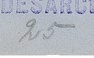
Wunsche
